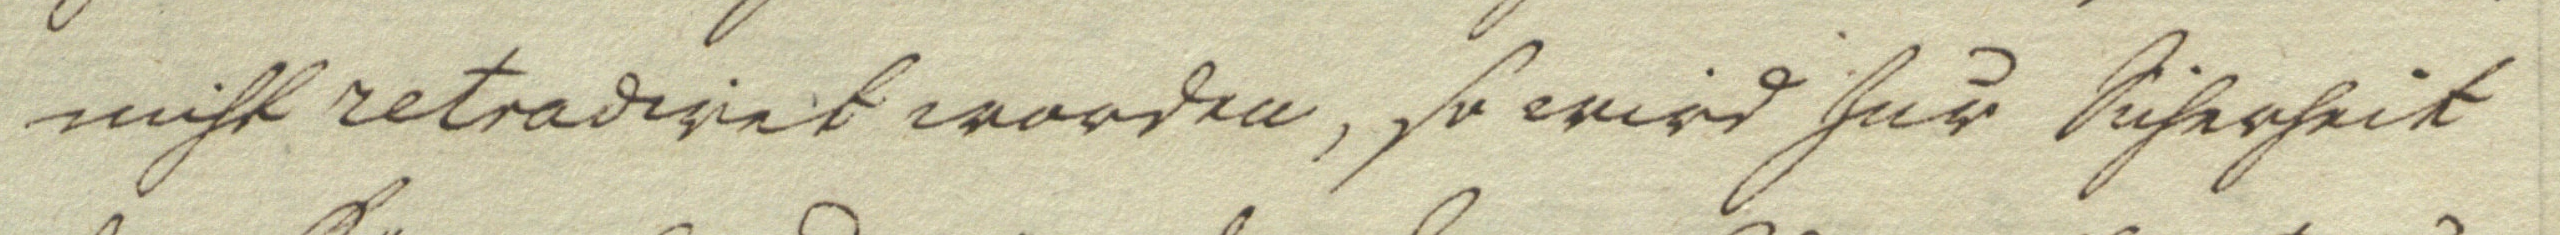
nicht retradiret worden, so wird zur Sicherheit
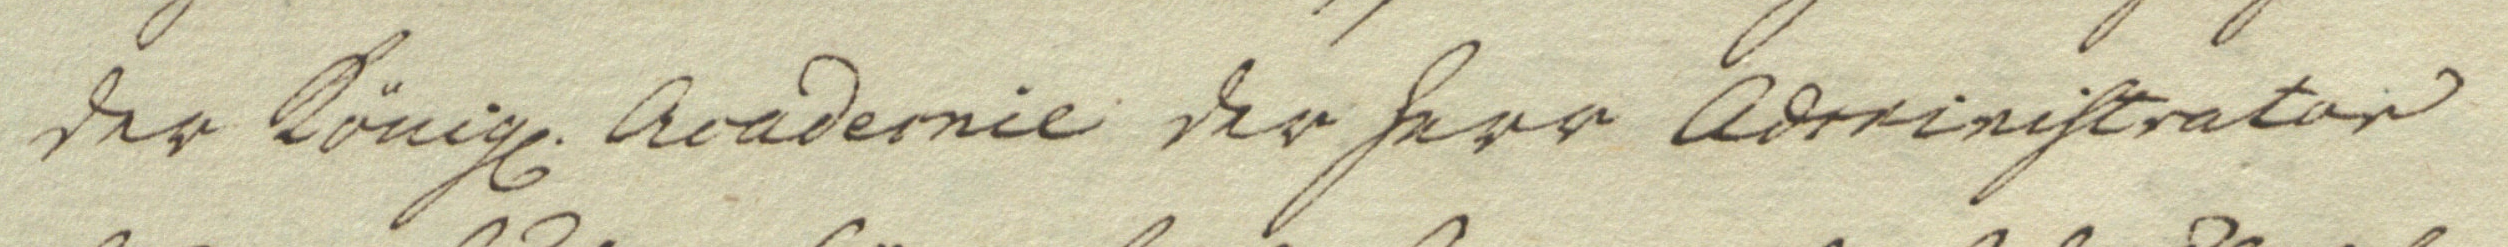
der Königl. Academie der Herr Administrator
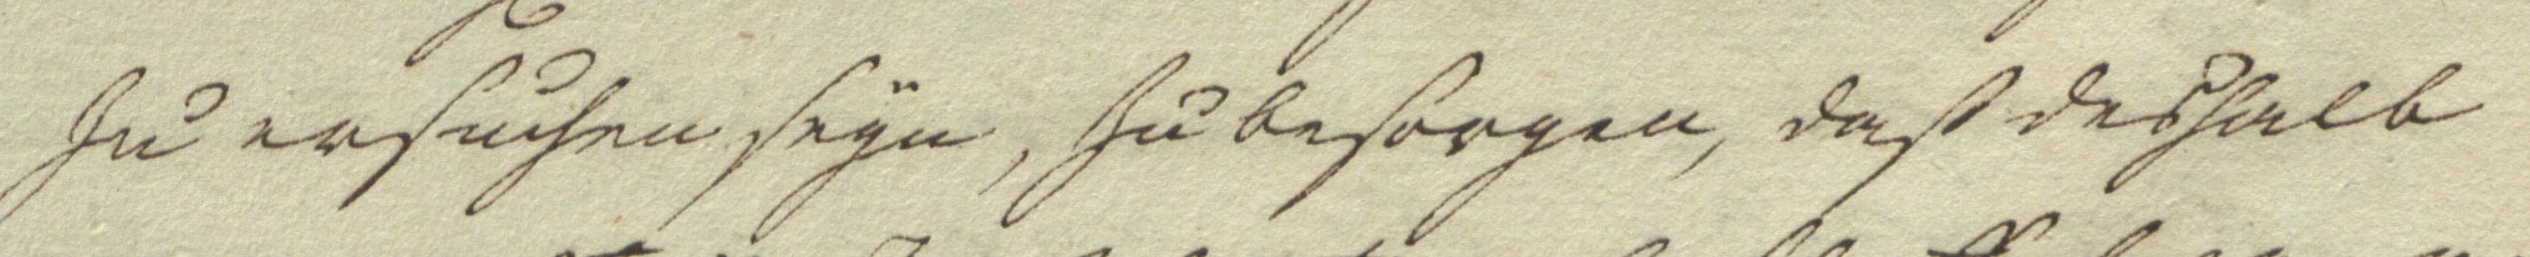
zu ersuchen seÿn, zu besorgen, daß deshalb
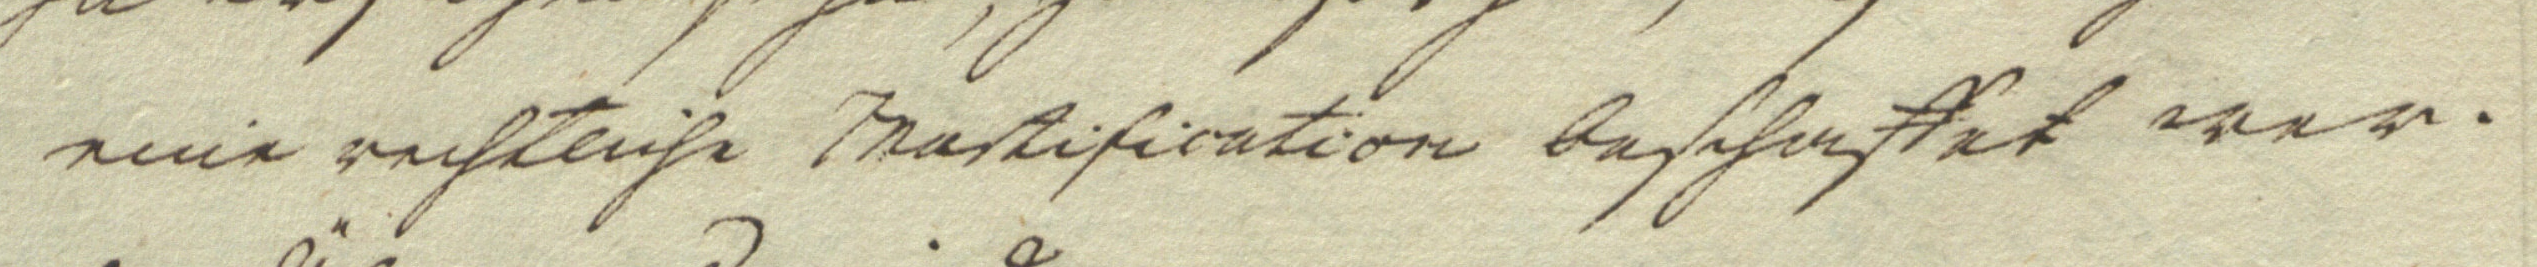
eine rechtliche Martification beschaffet wer¬
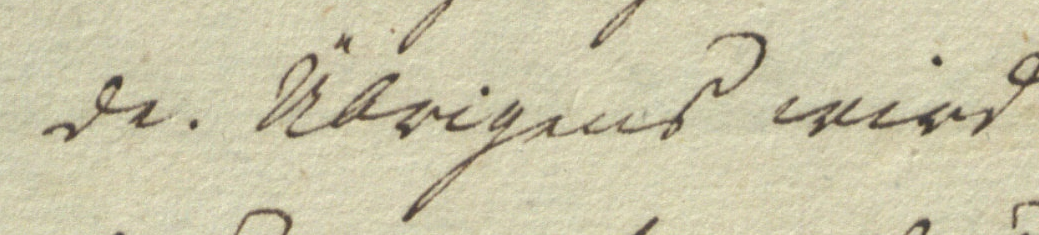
de. Übrigens wird
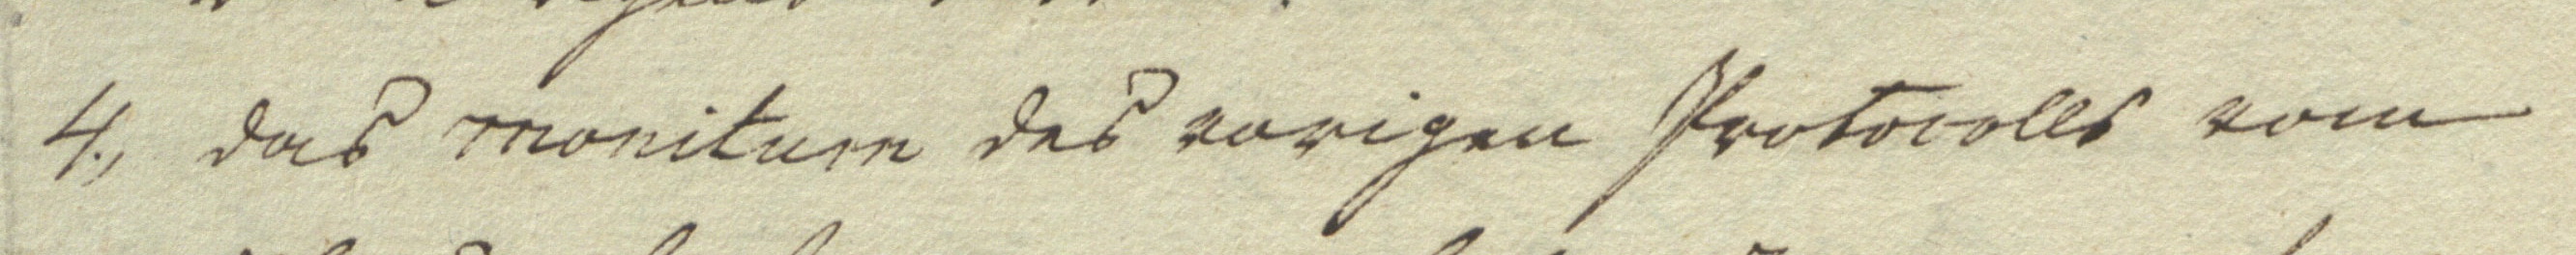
4., das monitum des vorigen Protocolls vom
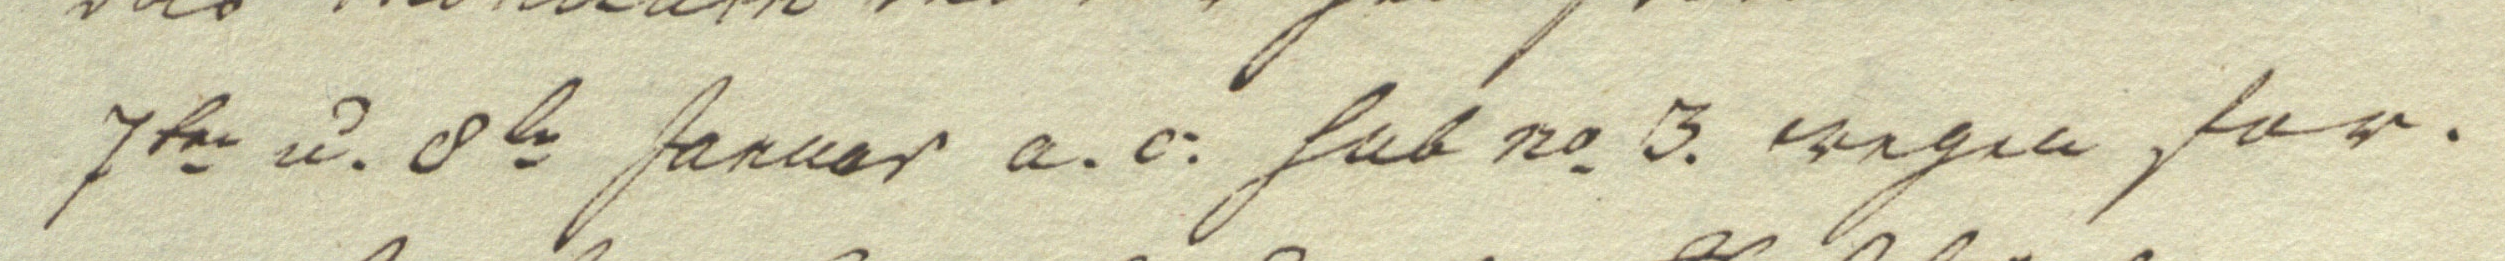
7 ten u. 8 ten Januar a. c. sub No 3. wegen for¬
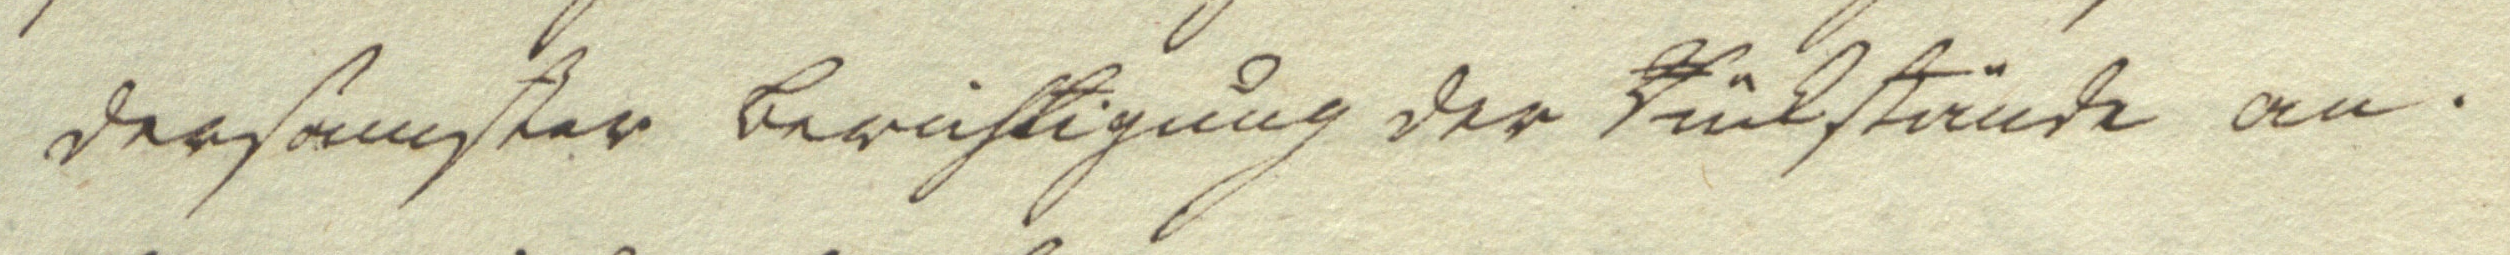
dersamster Berichtigung der Rückstände an¬
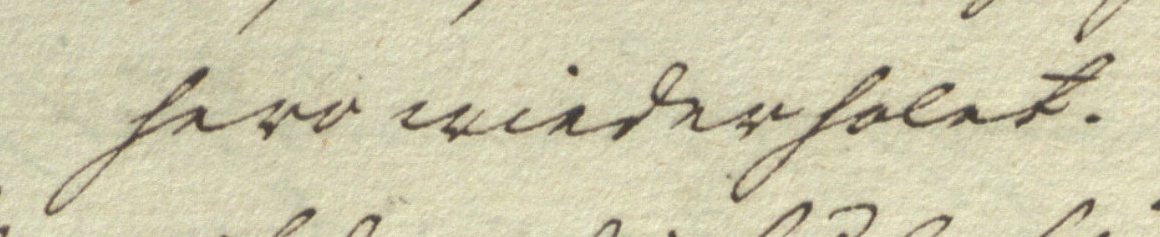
hero wiederholet.
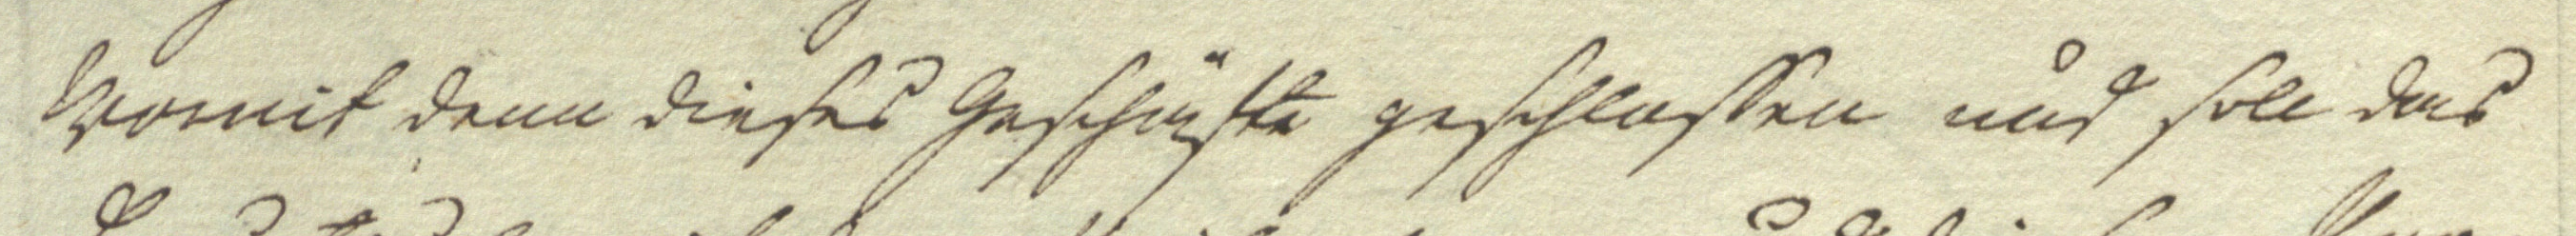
Womit denn dieses Geschäfte geschlossen und soll das
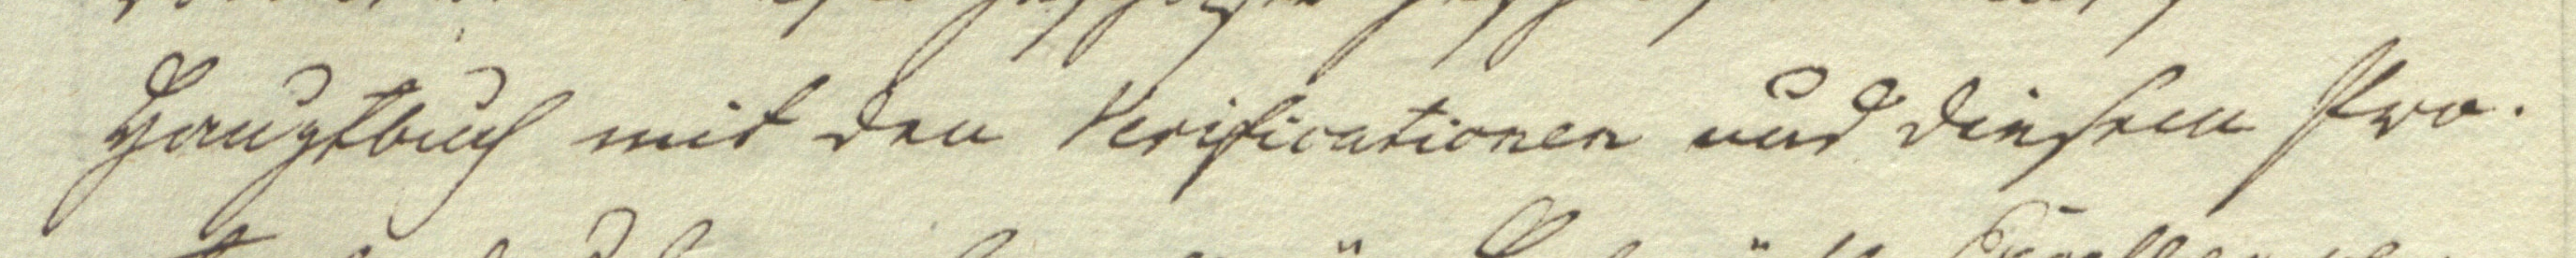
Hauptbuch mit den Verificationen und diesem Pro¬
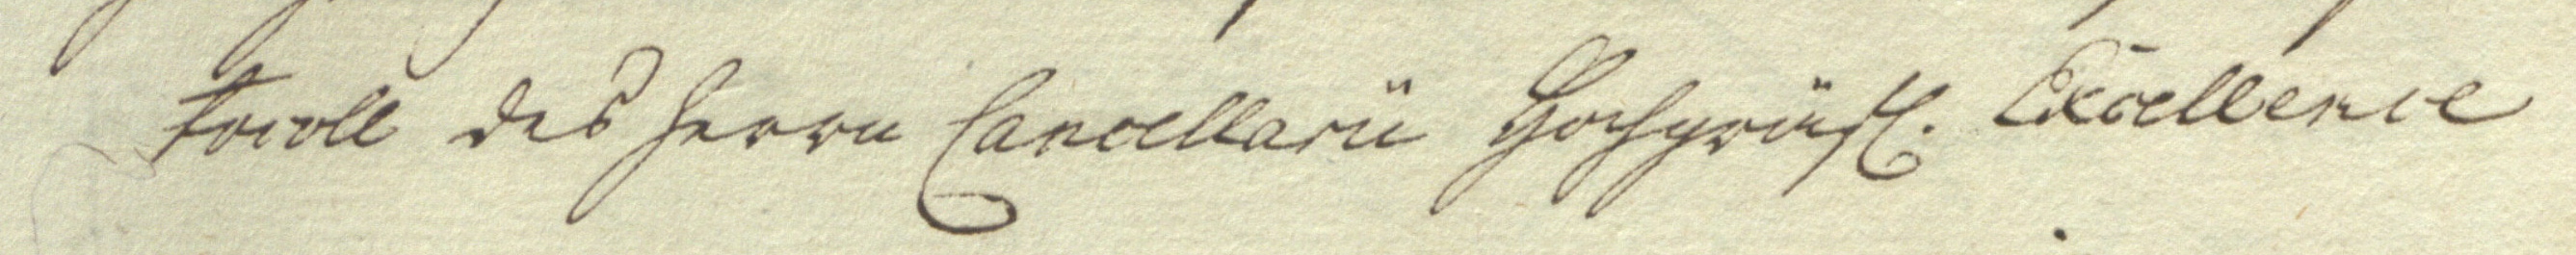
tocoll des Herrn Cancellarii Hochgräfl. Excellence
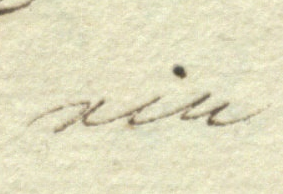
ein
